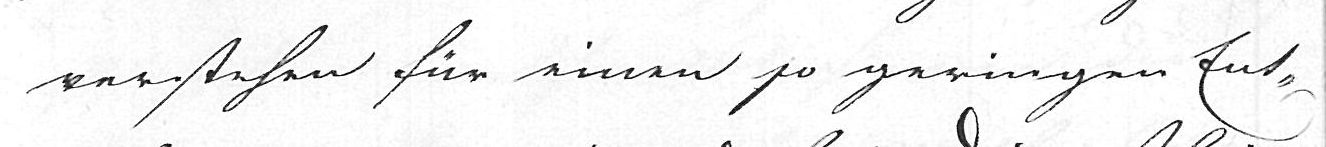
verstehen für einen so geringen Ent-
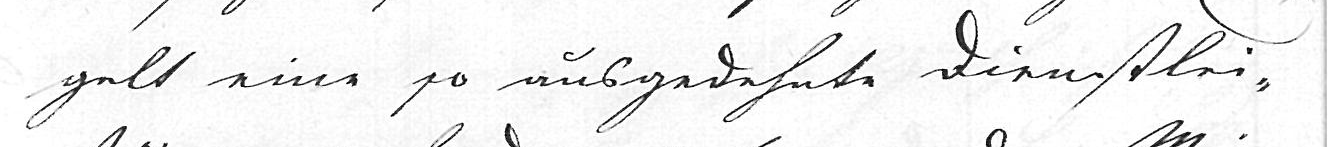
gelt eine so ausgedehnte Dienstlei-
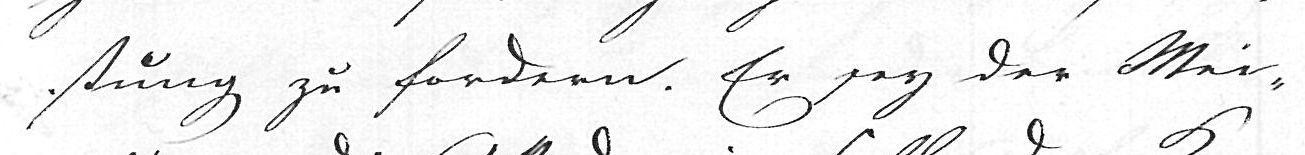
stung zu fordern. Er sey der Mein-
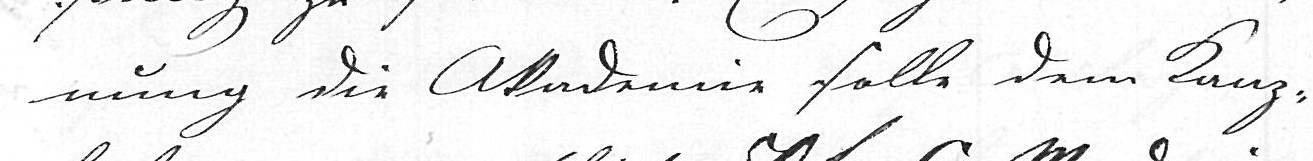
nung die Akademie solle dem Kanz-
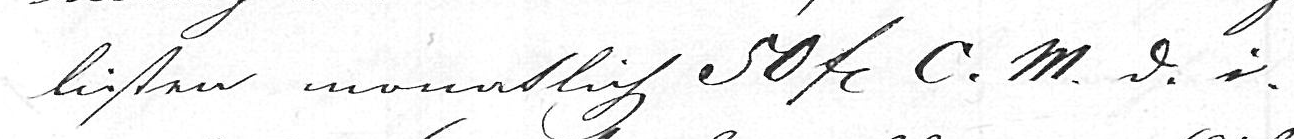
listen monatlich 50 fl C. M. d. i.
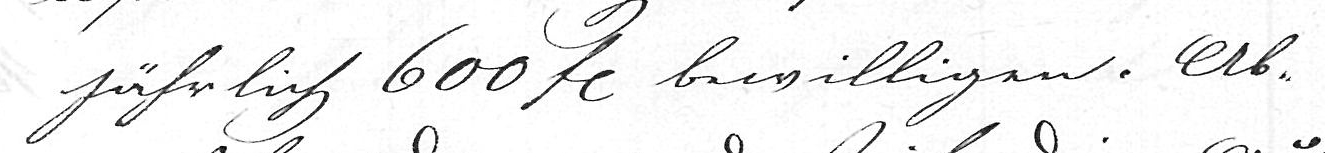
jährlich 600 fl bewilligen. Ab-
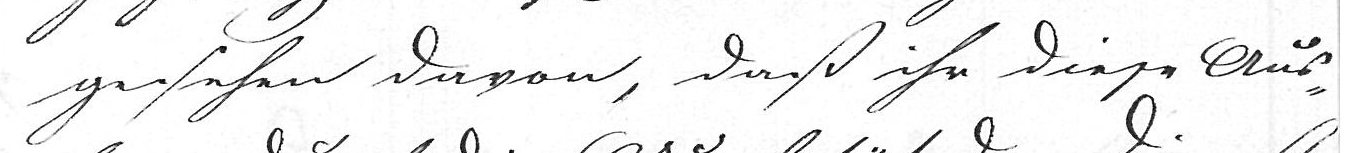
gesehen davon, daß ihr diese Aus-
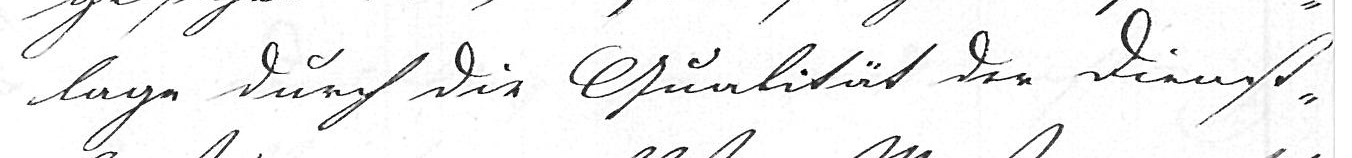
lage durch die Qualität der Dienst-
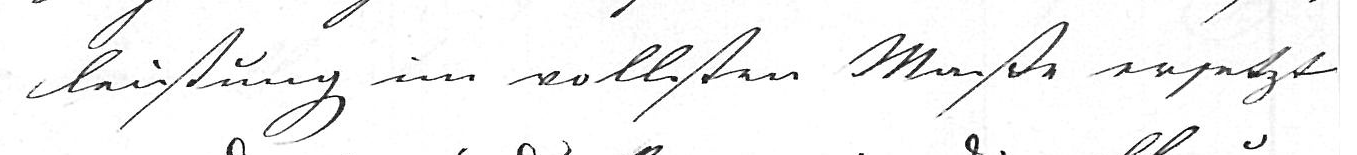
leistung im vollsten Maße ersetzt
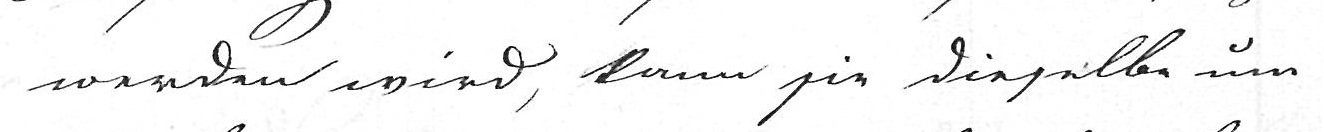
werden wird, kann sie dieselbe um
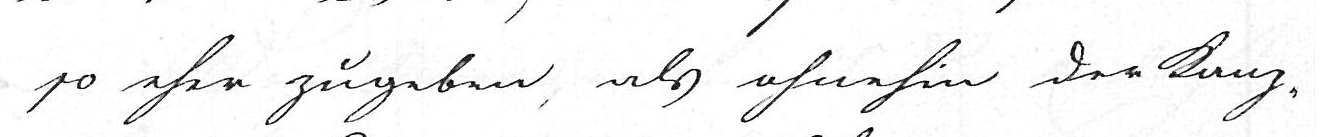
so eher zugeben, als ohnehin der Kanz-
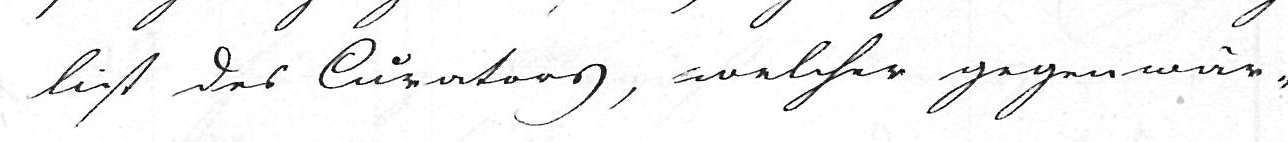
list des Curators, welcher gegenwär-
